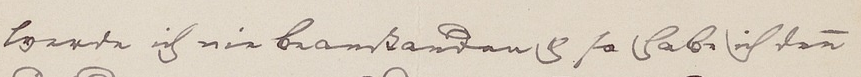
werde ich nie beanstanden & so habe ich denn
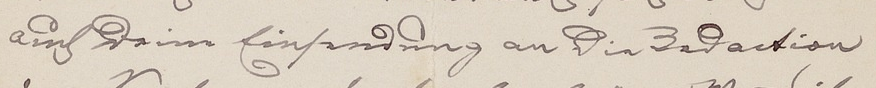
auch Deine Einsendung an die Redaction
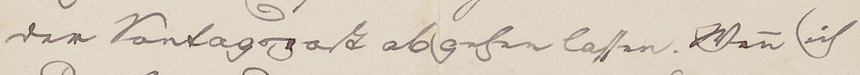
der Sontagspost abgehen lassen. Wenn ich
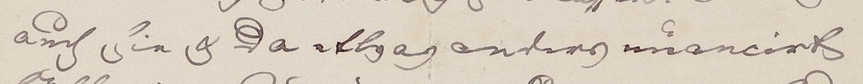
auch hie & da etwas anders nuancirt
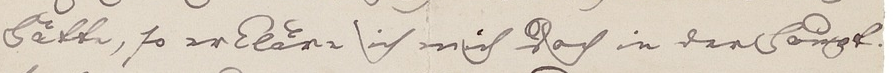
hätte, so erkläre ich mich doch in der Haupt-
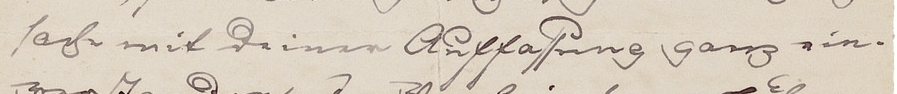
sache mit Deiner Auffassung ganz ein-
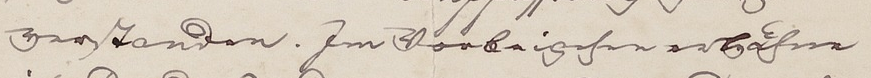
verstanden. Im Vorbeigehen erwähne
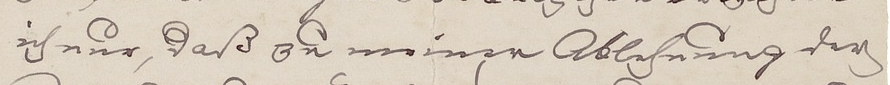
ich nur, daß zu meiner Ablehnung der
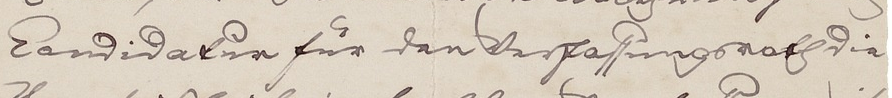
Candidatur für den Verfassungsrath die
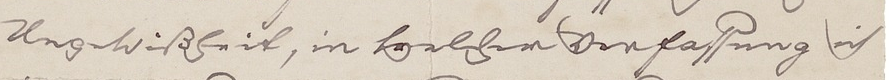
Ungewißheit, in welcher Verfassung ich
